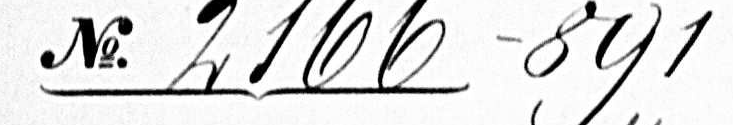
No 2015– 1891
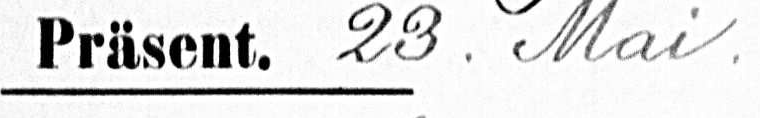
Präsent. – 23. Mai
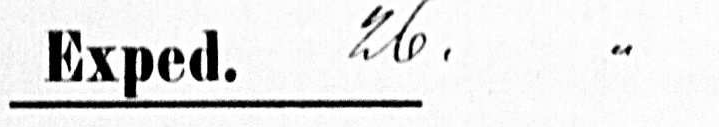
Exped. – 26. „
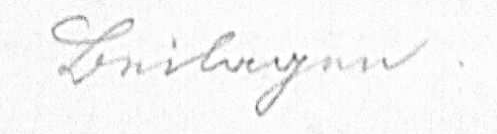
Beilagen
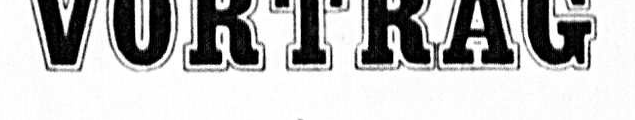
VORTRAG
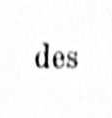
des
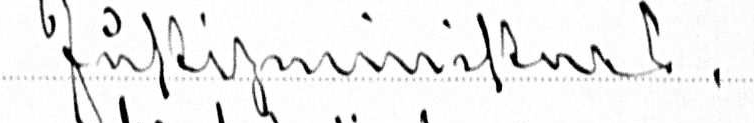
Justizministers,
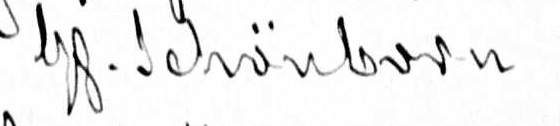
Gf. Schönborn
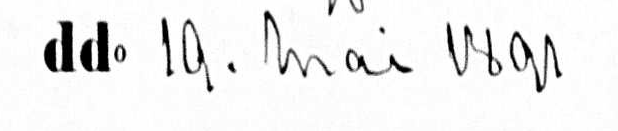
ddo 19. Mai 1891
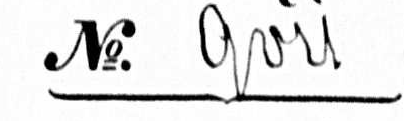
No. 9011
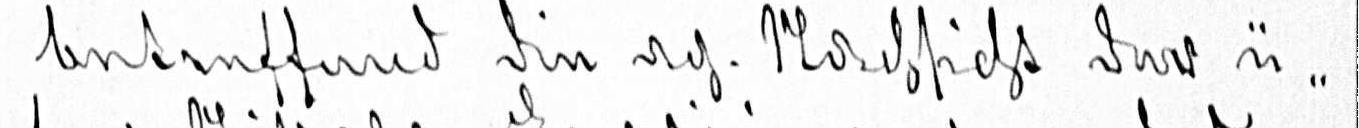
betreffend die ag. Nachsicht der ü¬
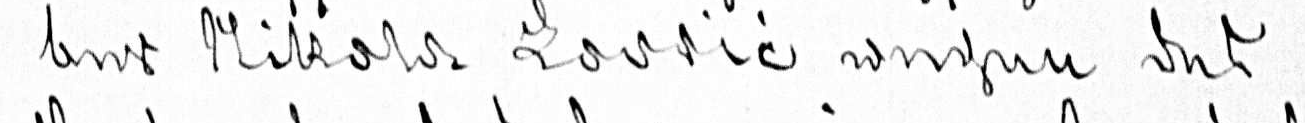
ber Nikola Lovrić wegen des
